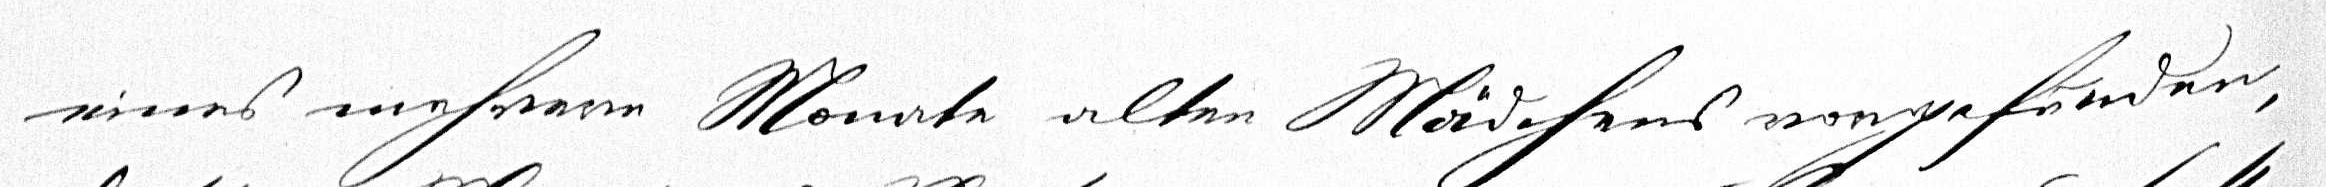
eines mehrere Monate alten Mädchens vorgefunden,
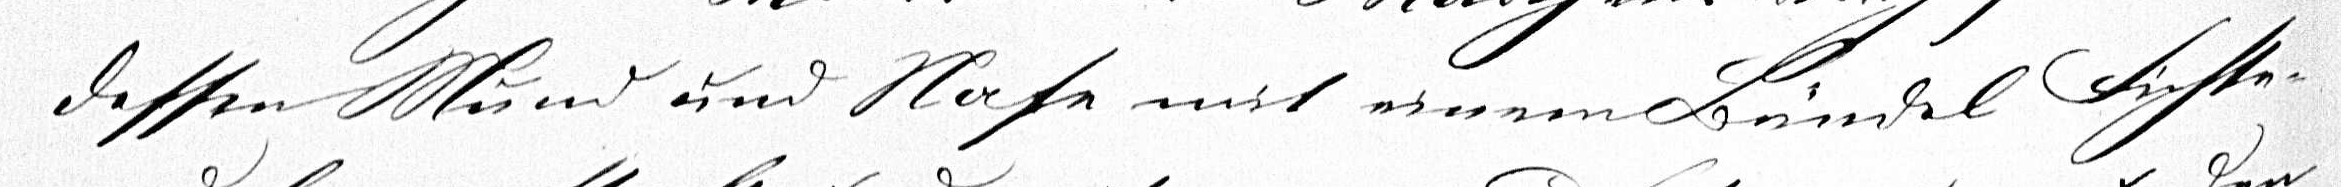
dessen Mund und Nahe mit einem Bändel Fichte¬
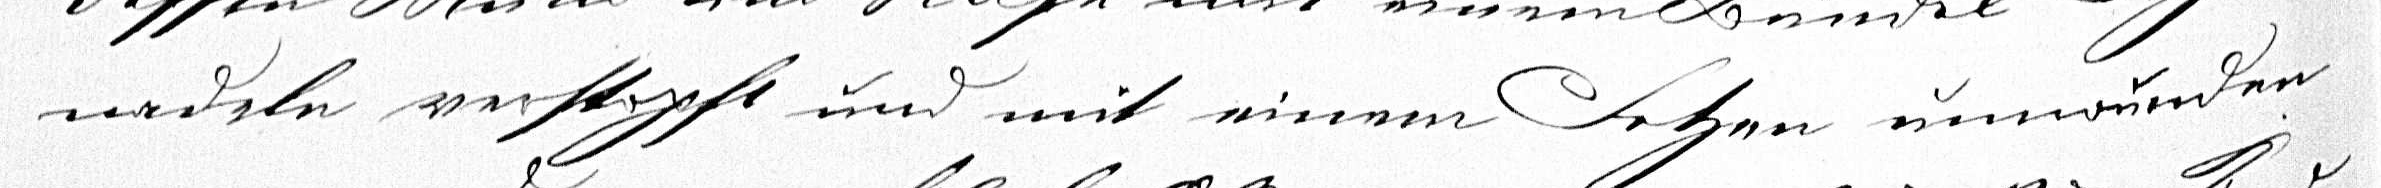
nadeln verstopft und mit einem Fetzen umwunden
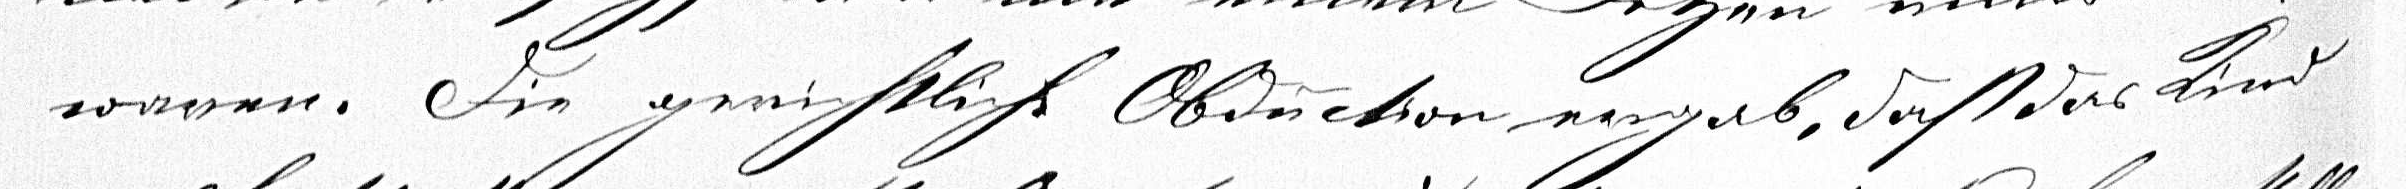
waren. Die gerichtlich Obduction ergab, daß das Kind
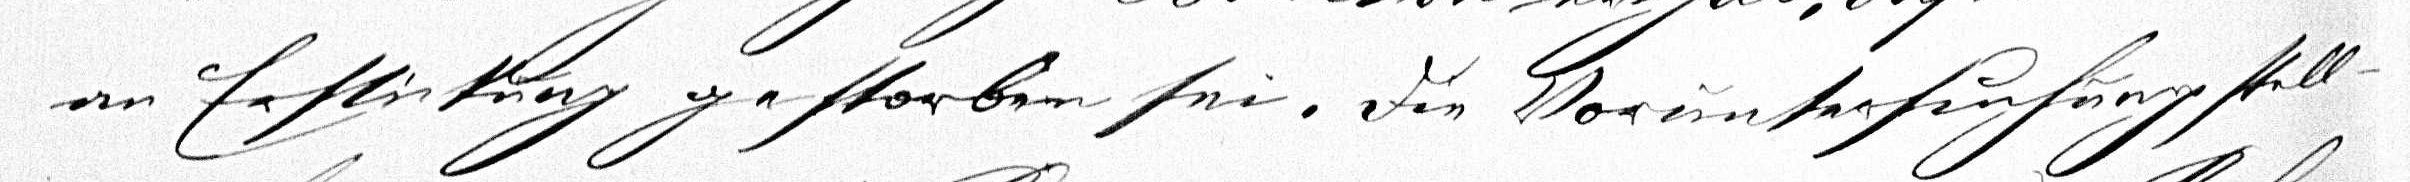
an Erstickung gestorben sei. Die Voruntersuchung stell¬
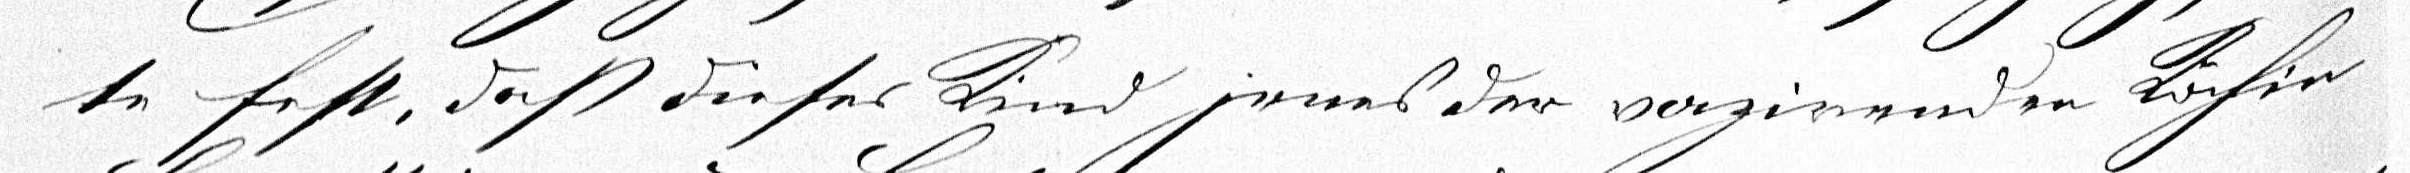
te fest, daß dieses Kind jenes der vorzirenden Köchin
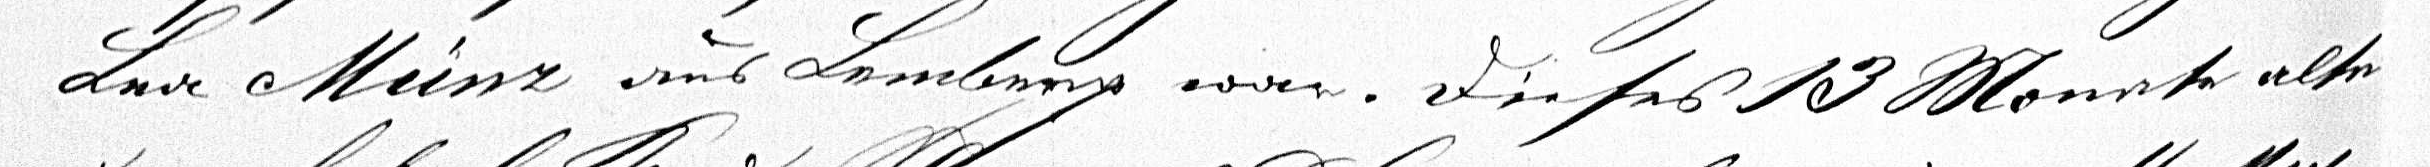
Lea Münz aus Lemberg war. Dieses 13 Monate alte
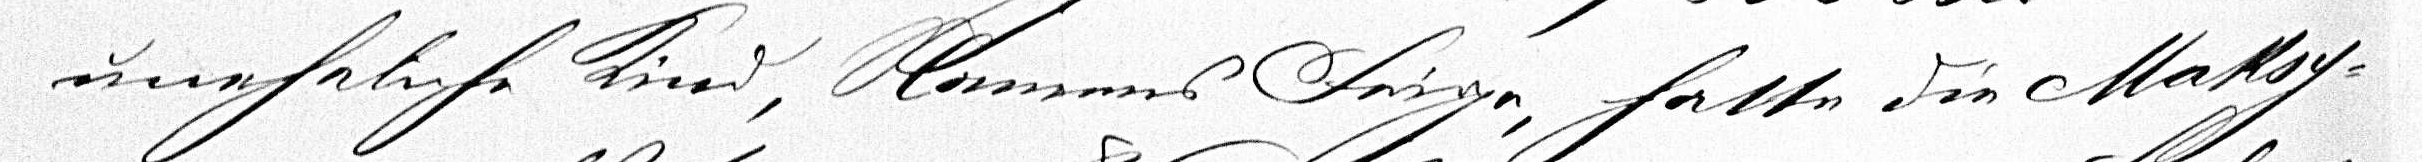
uneheliche Kind, Namens Feige, hatte die Maksy¬
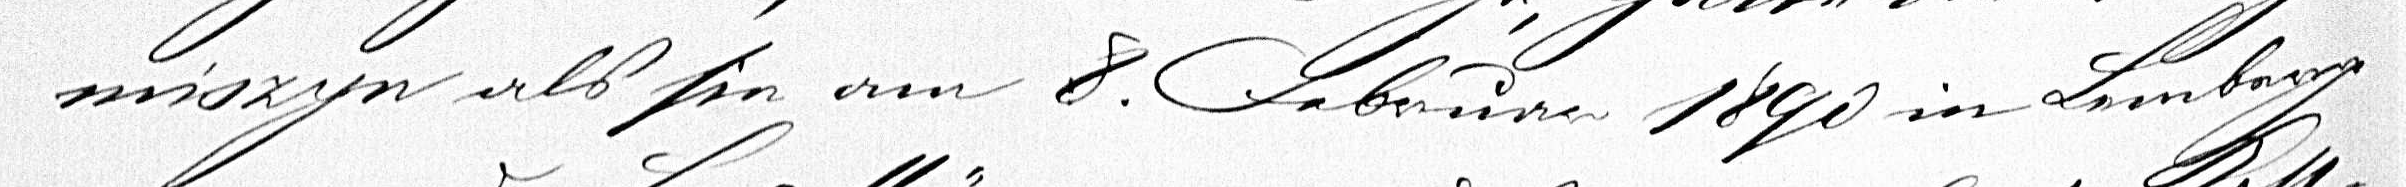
miszym als sie am 8. Februar 1890 in Lemberg
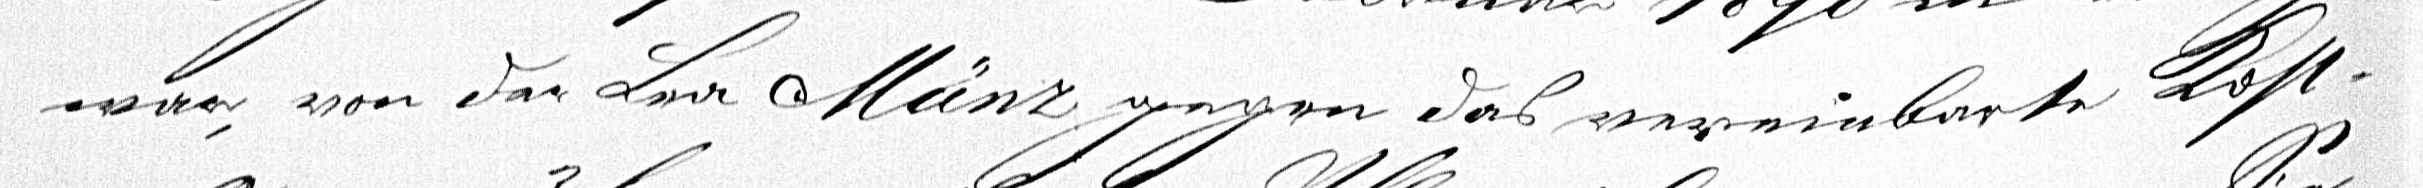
war, von der Lea Münz gegen das vereinbarte Kost¬
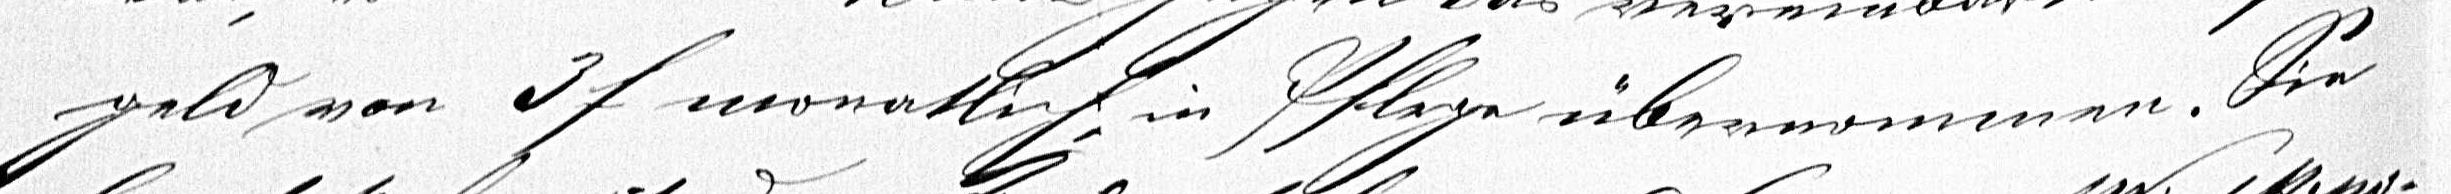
geld von 3f monatlich, in Pflege übernommen. Sie
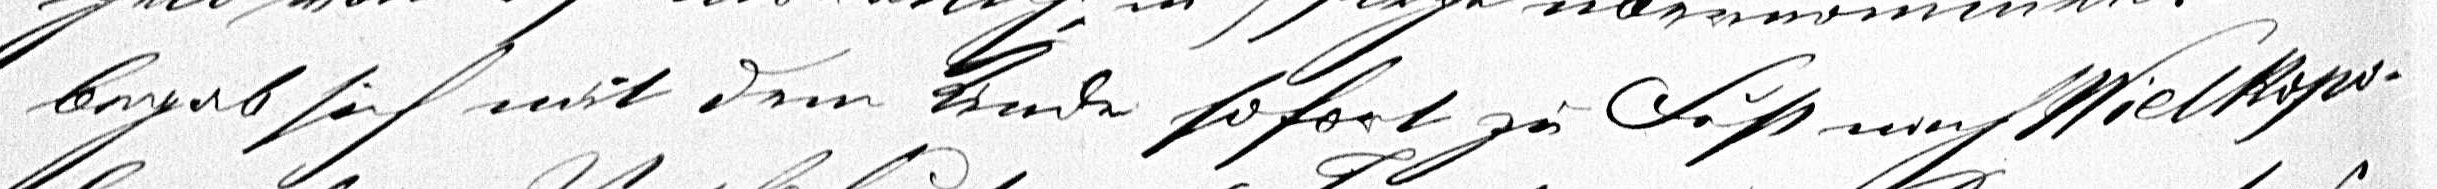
begab sich mit dem Rinde sofort zu Fuß xx Wielkopo¬
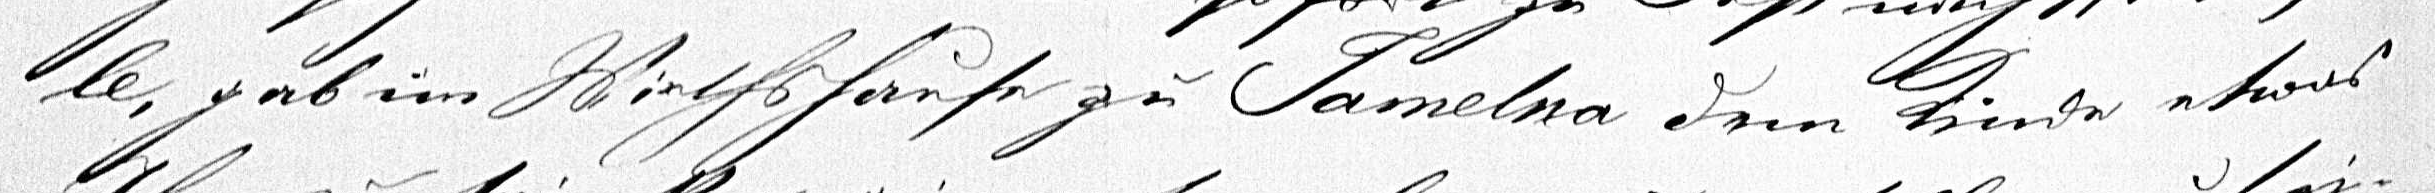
le, gab im Wirthshause zu Tamelna dem Kinde etwas
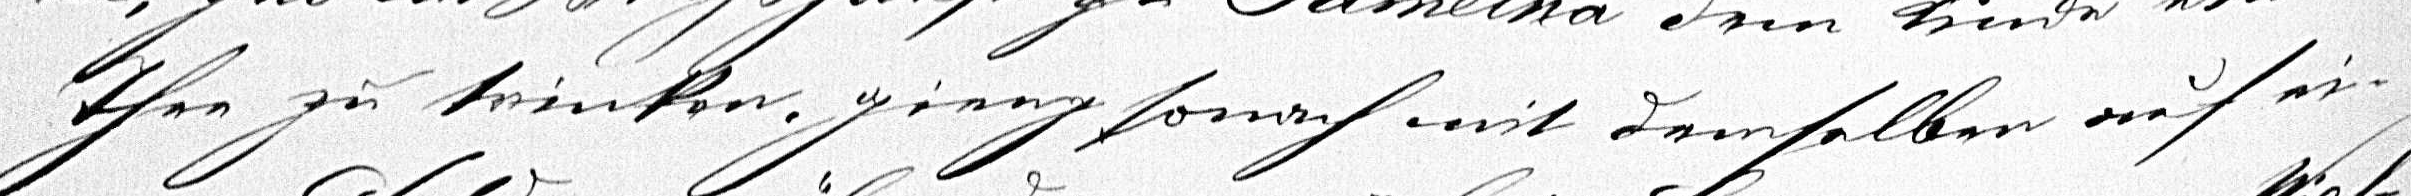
Thee zu trinken, gieng sonach mit demselben auf ei¬
